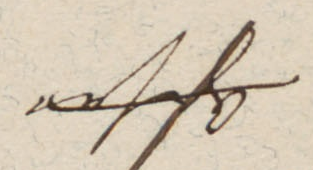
und Decken
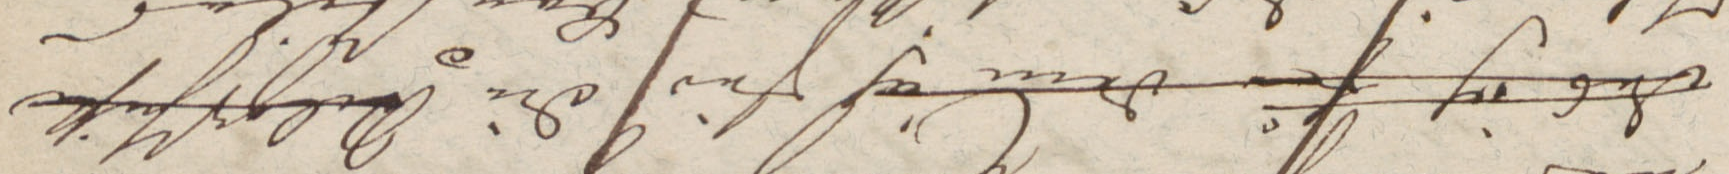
das wir das ich für dem ich für die Stilgeschichte
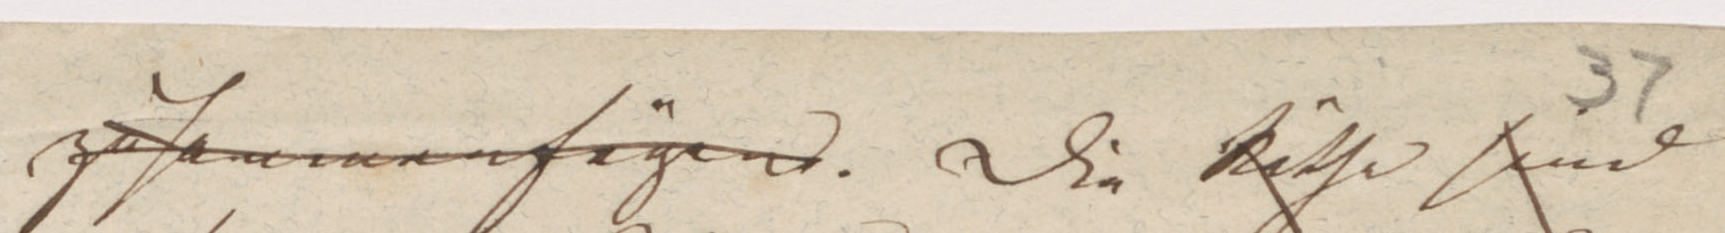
zusammenfügen. Die Näthe sind
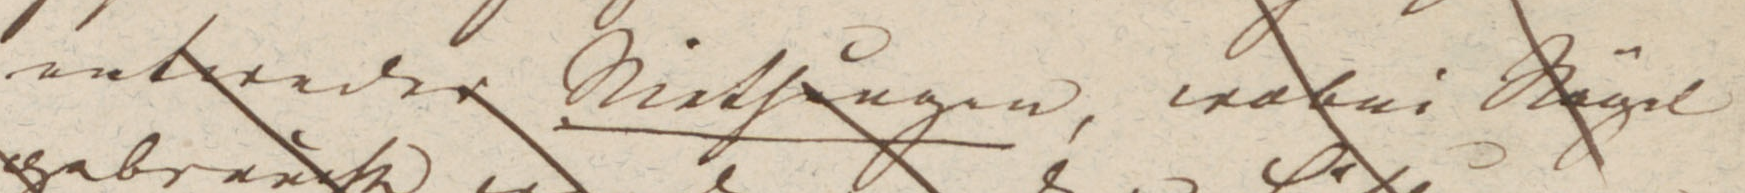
entweder Niethungen, wobei Nägel
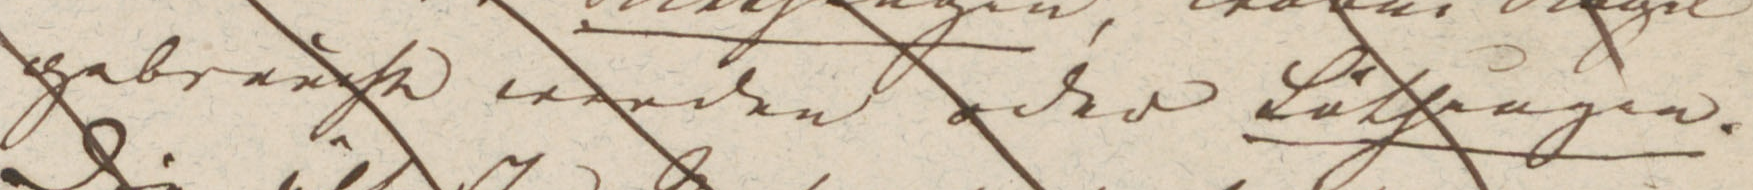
gebraucht werden oder Löthungen.
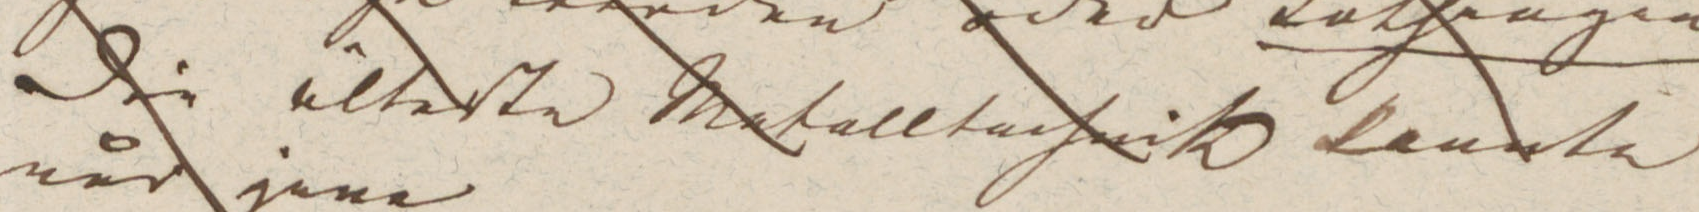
Die älteste Metalltechnik kannte
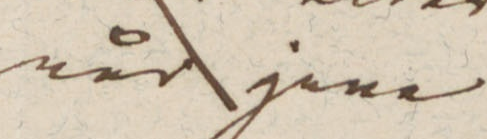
nur jene
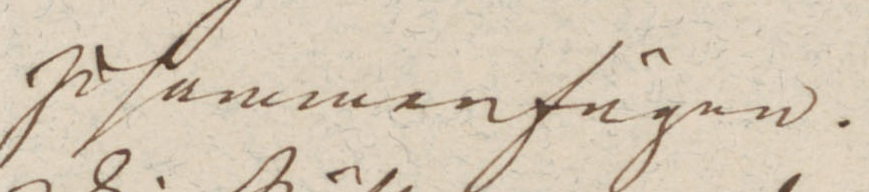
zusammenfügen.
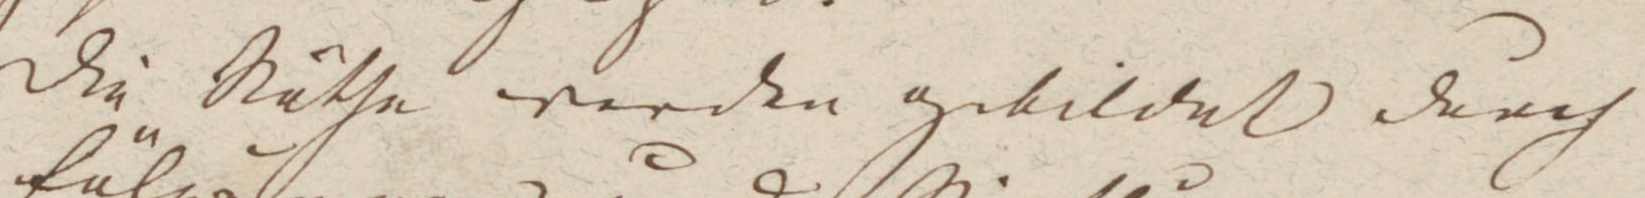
Die Näthe werden gebildet durch
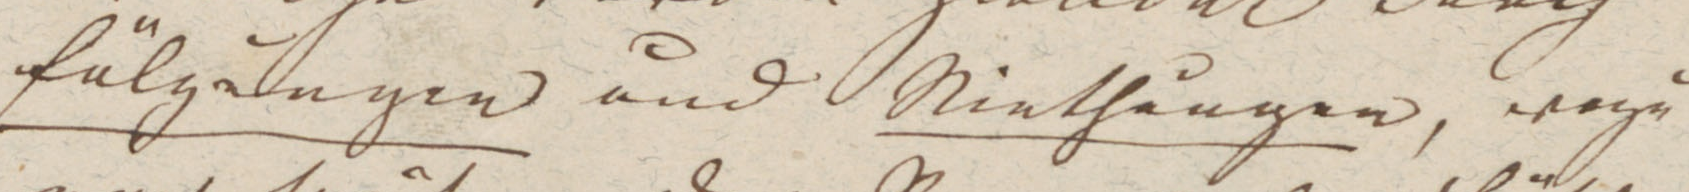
Fälzungen und Niethungen, wozu
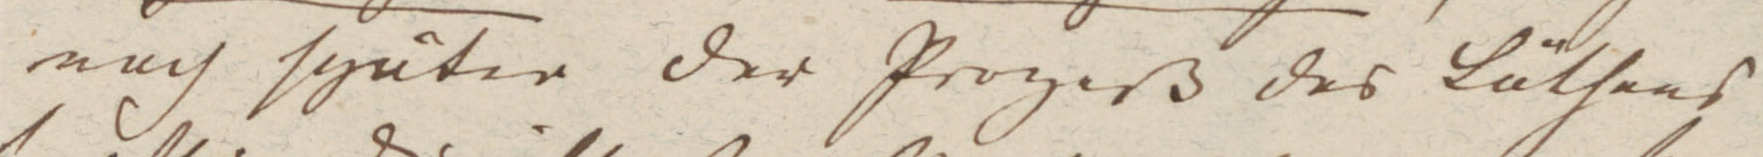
noch später der Prozess des Löthens
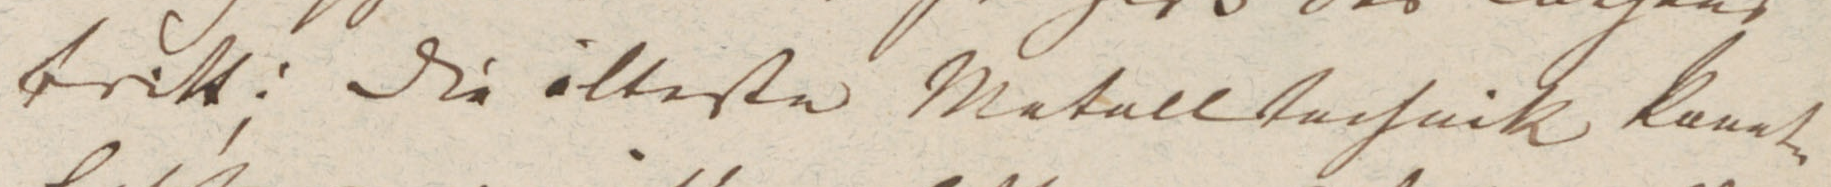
tritt; Die älteste Metalltechnik kannte
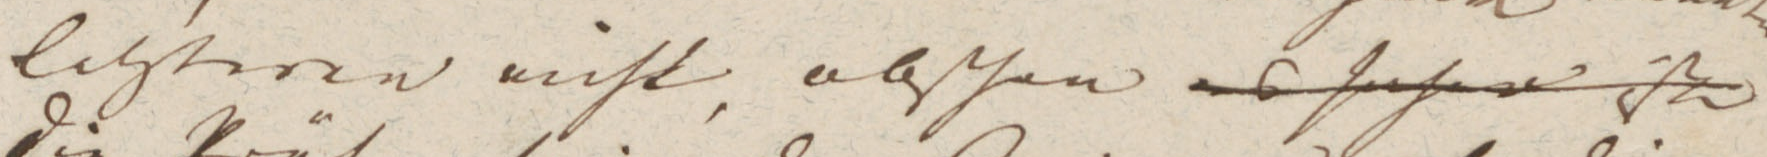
letzteren nicht, obschon es sicher ist
